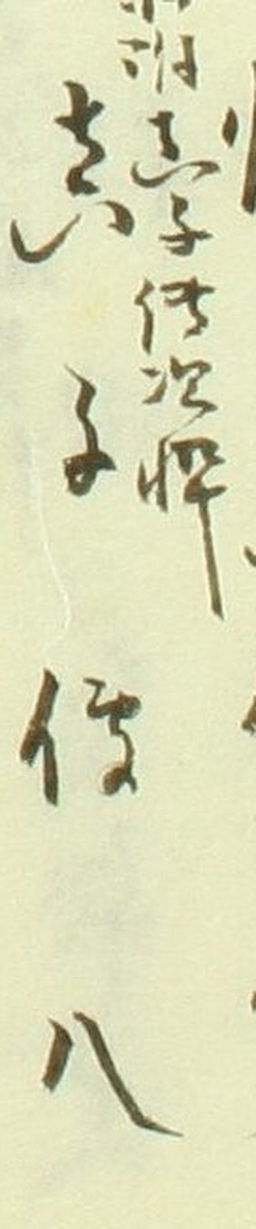真子伝八
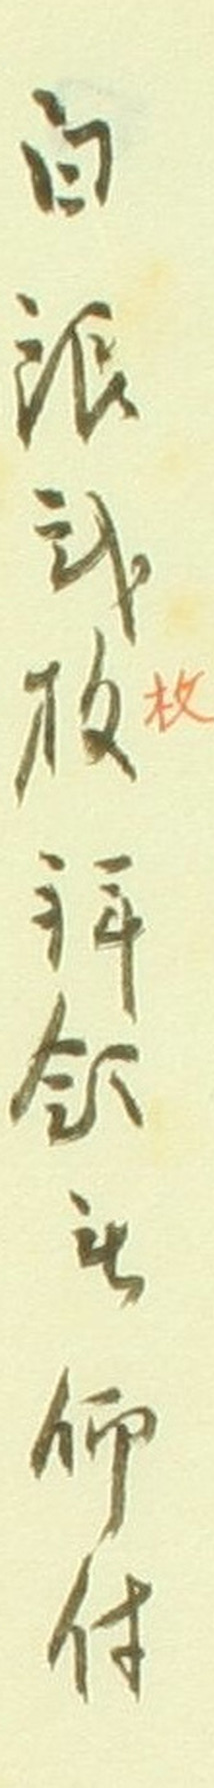白銀壱枚拝領被仰付
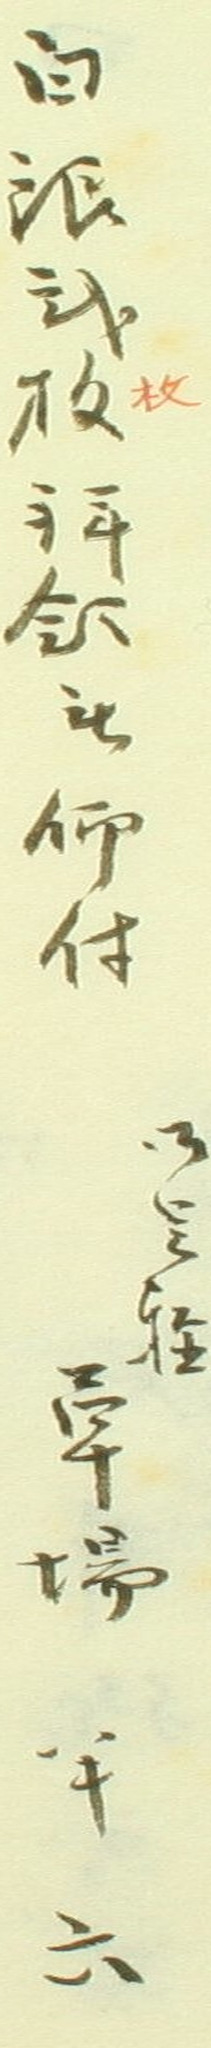白銀弐枚拝領被仰付御足軽
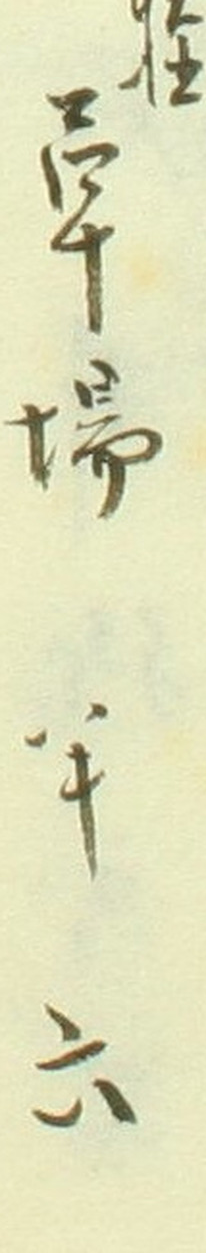草場半六
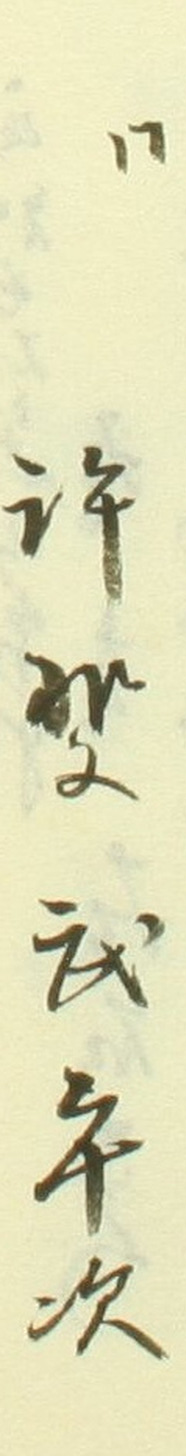許斐武平次
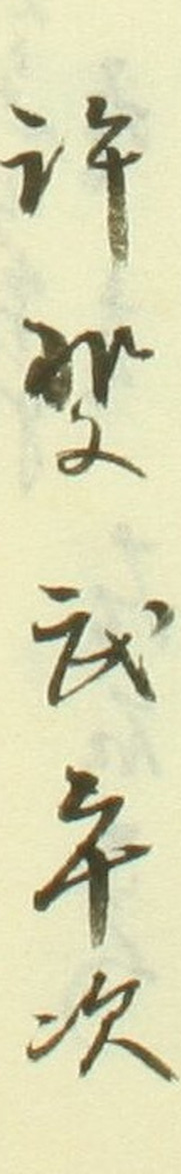許斐武平次
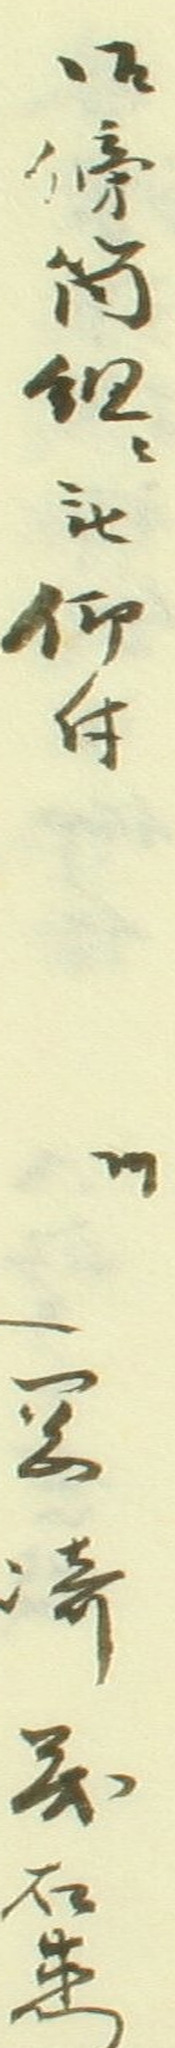御傍筒組に被仰付同関崎義右衛門
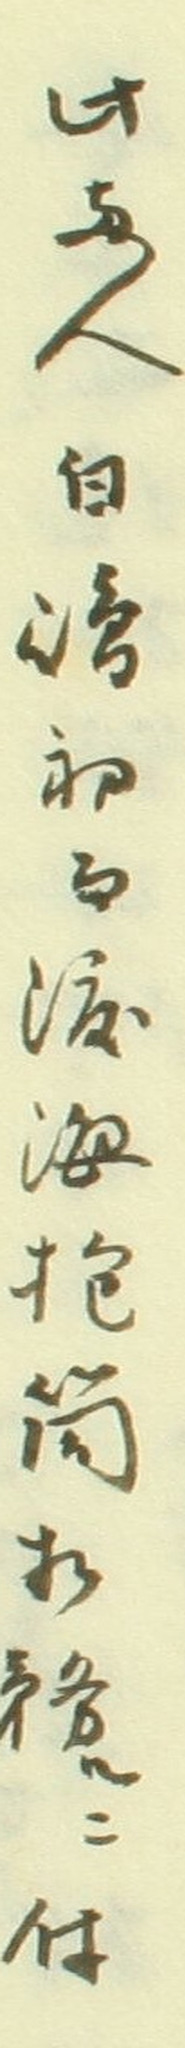此両人白嶋初而渡海抱筒相務るに付
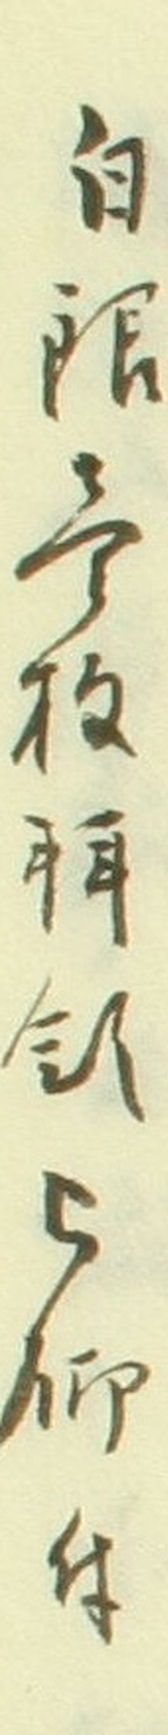白銀壱枚拝領被仰付
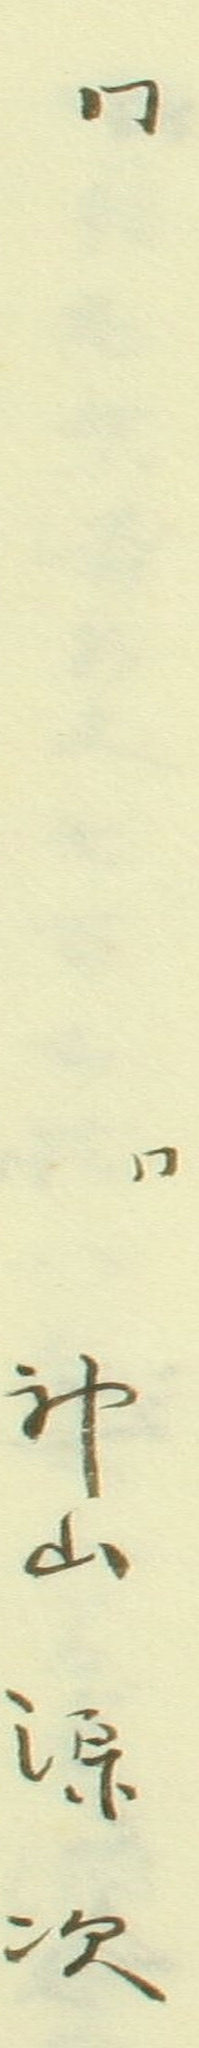同同神山げ源次

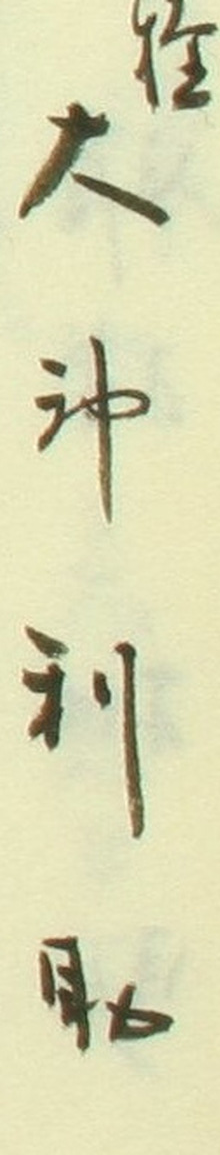大神利助
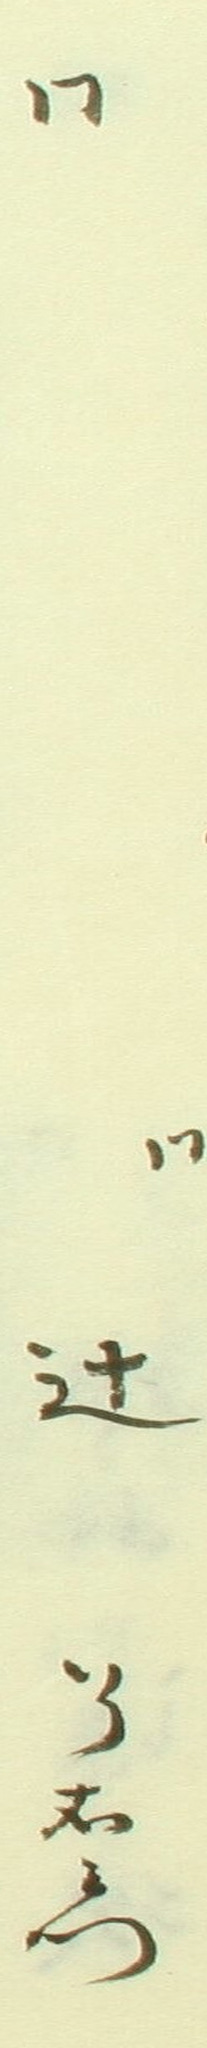同同辻了右衛門
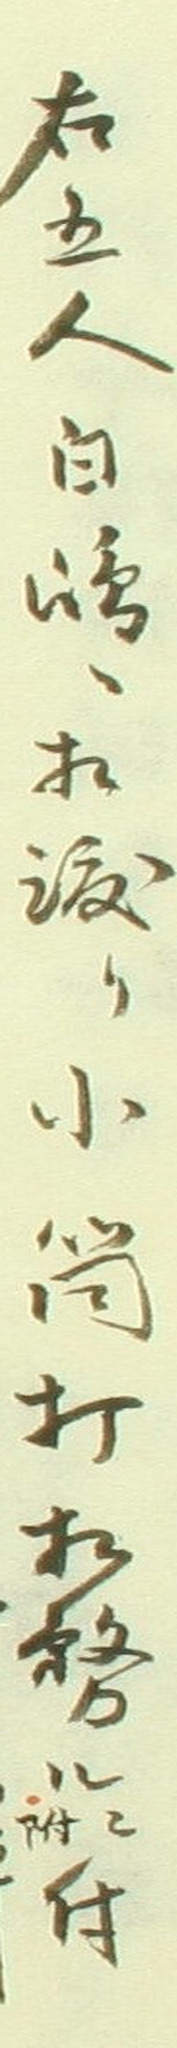右五人白嶋へ相渡り小筒打相務るに附き付
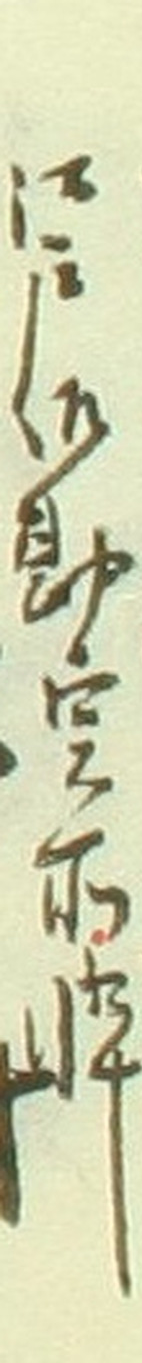江戸御勘定所倅
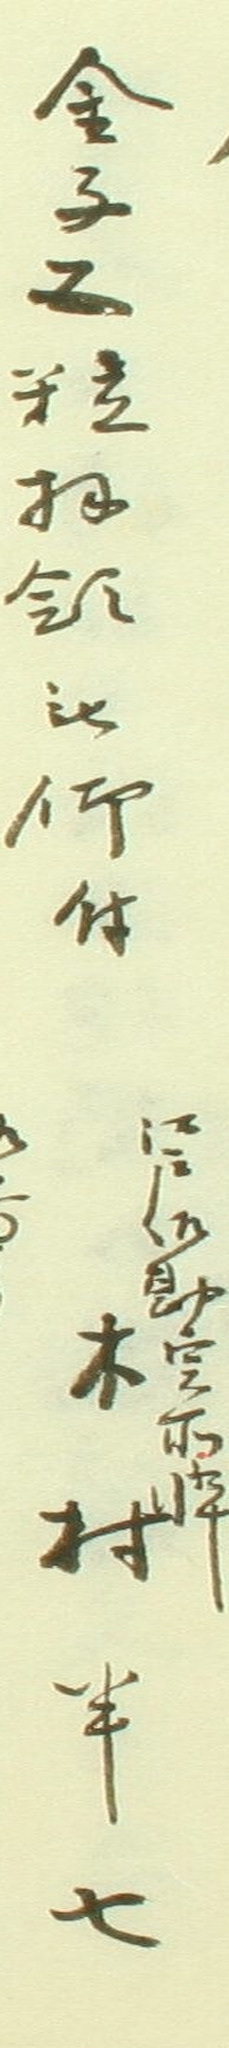金子五粒拝領被仰付御番方
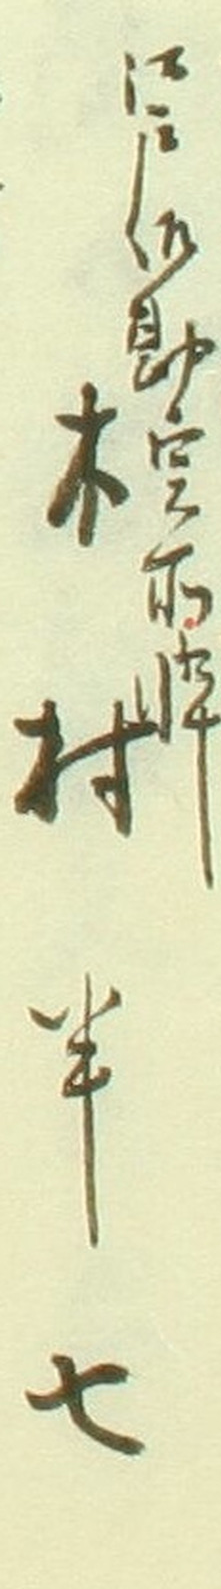木村半七
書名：唐船漂流記 三
